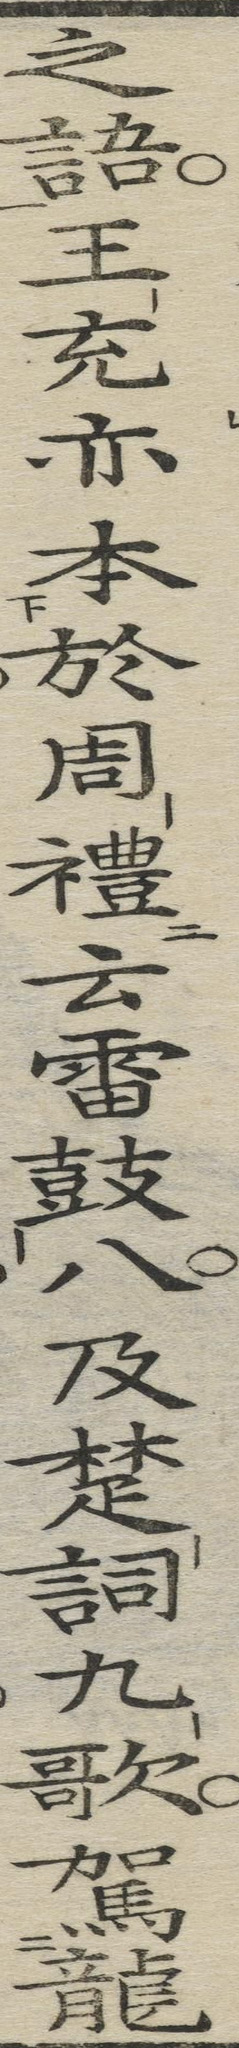之語王充亦本於周礼ニ云雷鼓ハ及楚詩九歌駕龍
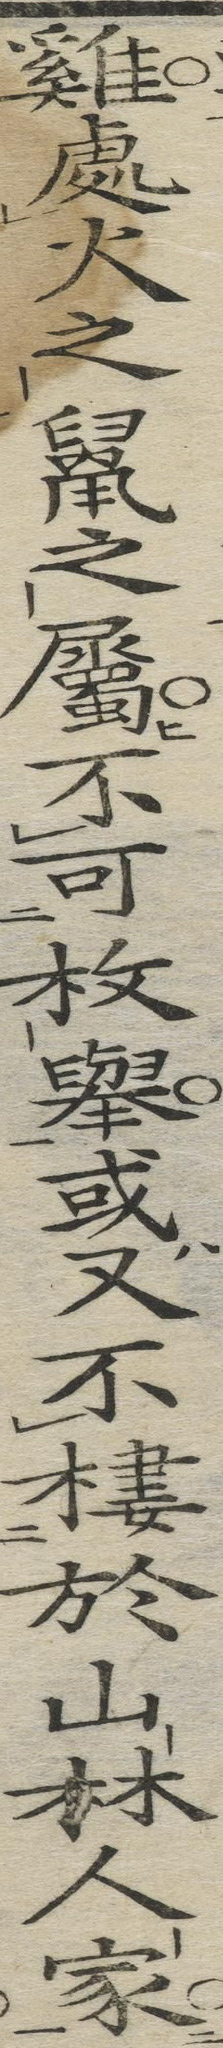鶏処火之鼠之属ヒ不可枚挙或ハ又不棲山林人家
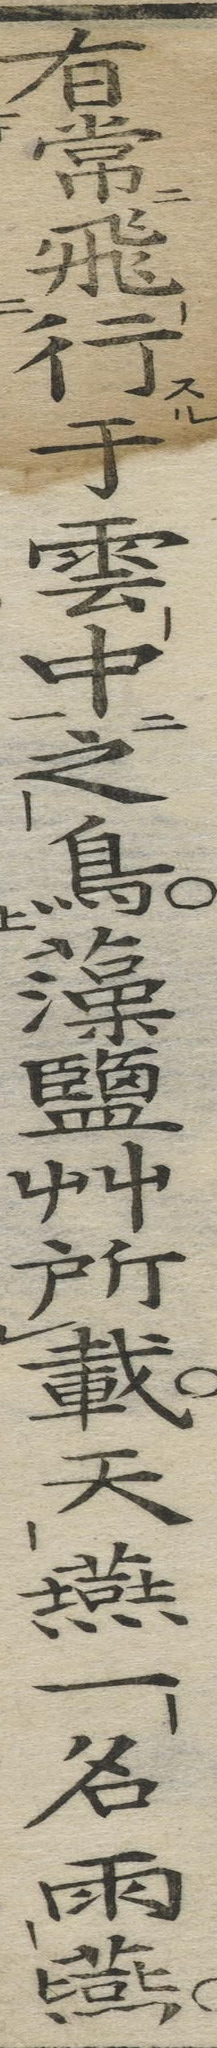有常ニ飛行スル干雲中ニ之鳥藻塩草所載天燕一名雨燕
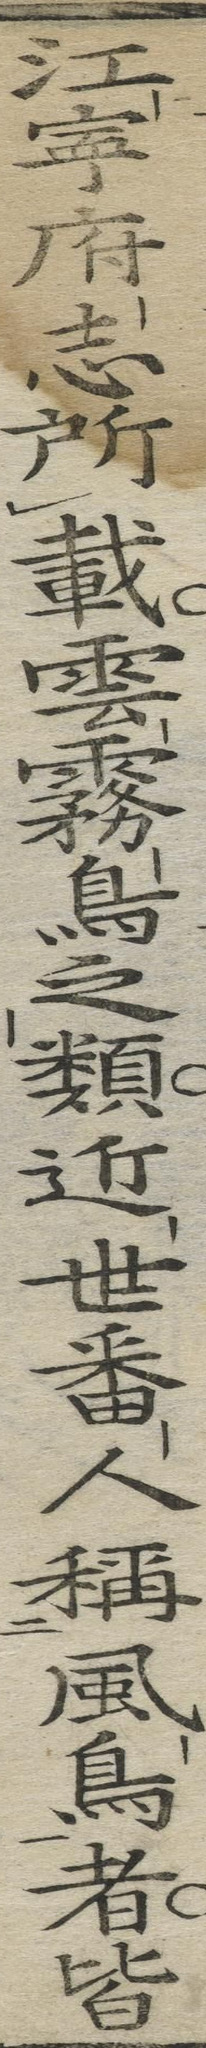江祢寧府志所載雲霧鳥之類近世番人称風鳥者皆
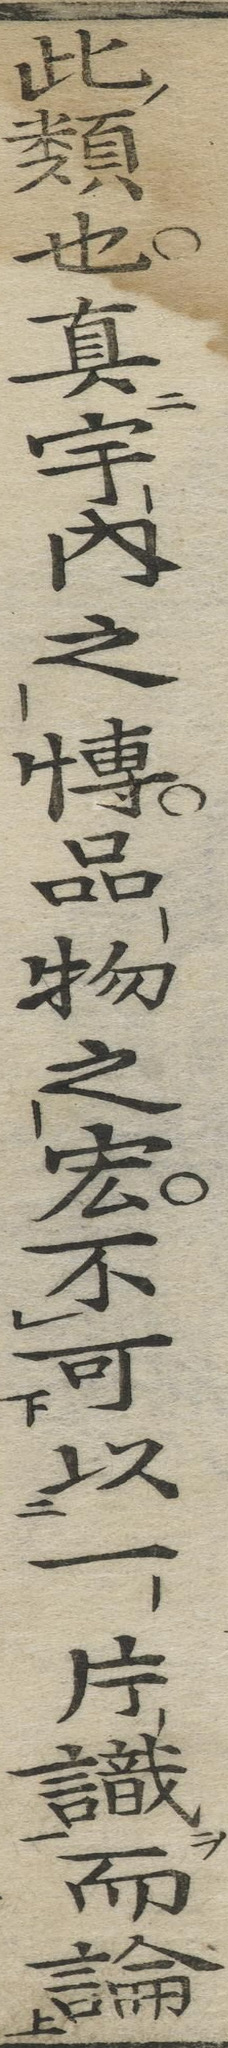此類也真ニ宇内之博品者之宏不可以一片識ヲ而論
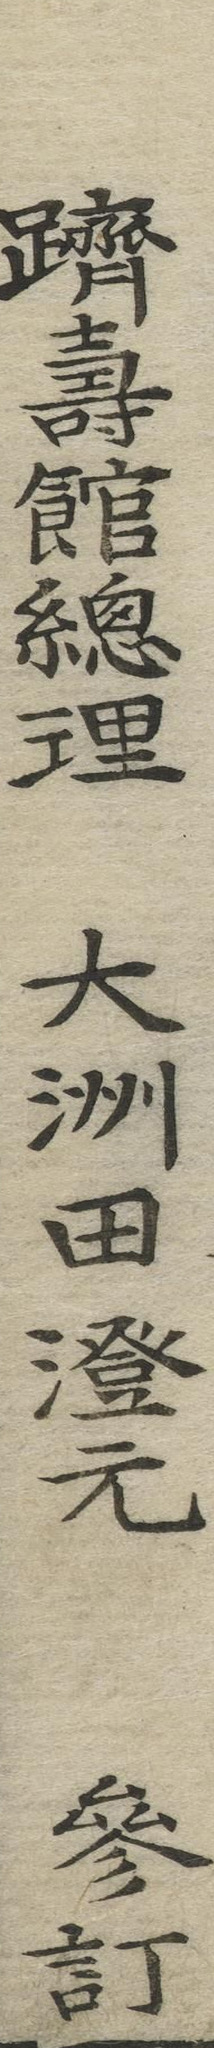焉躋壽館総理大洲田澄元参訂

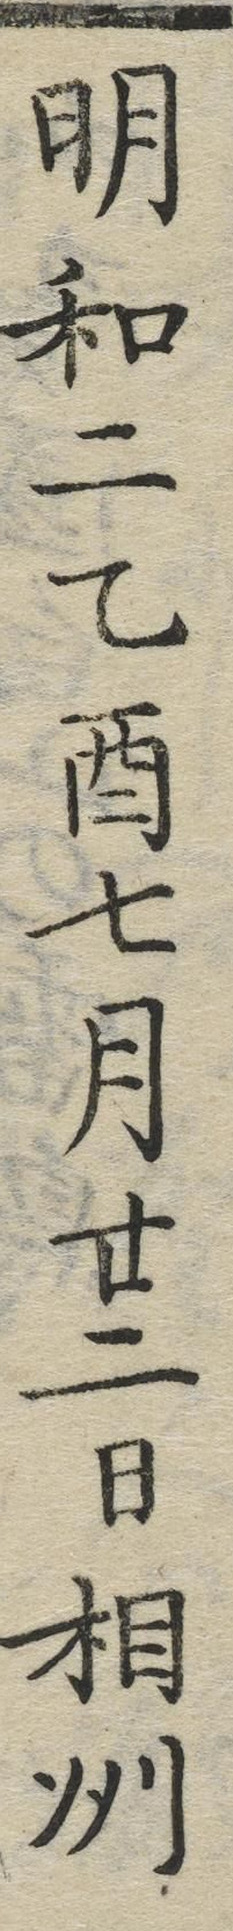明和二乙酉七月二十二日相州
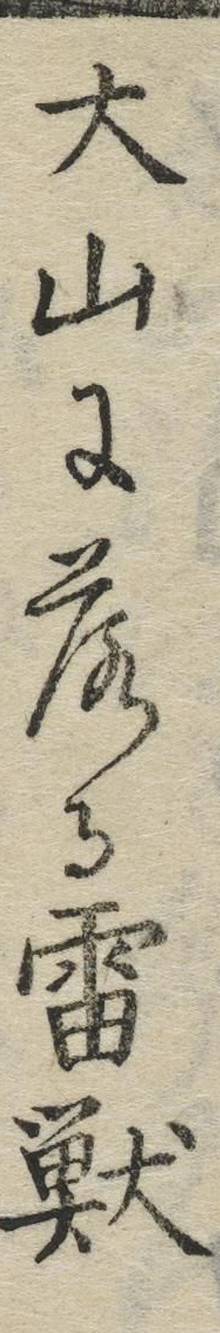大山に落る雷獣

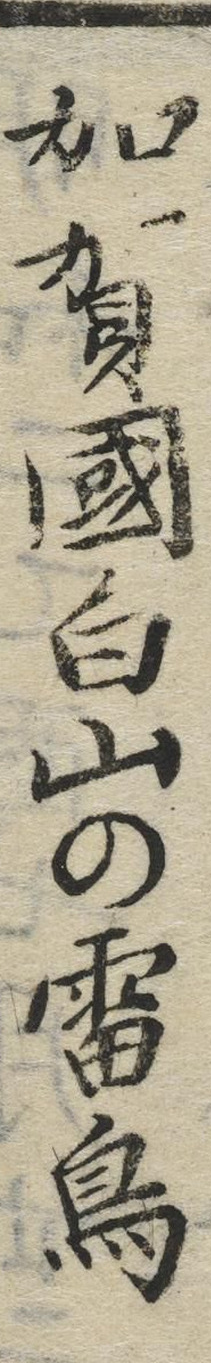加賀国白山の雷鳥
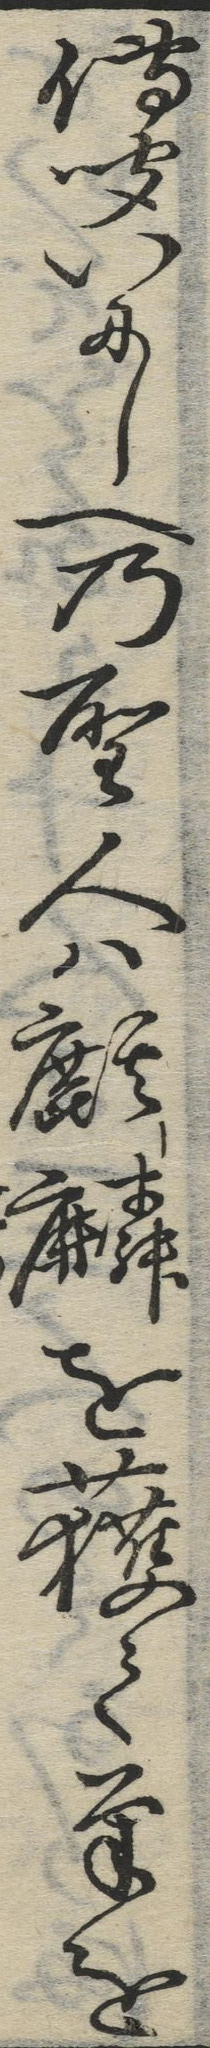伝聞いにしへの聖人は麒麟を獲て筆を
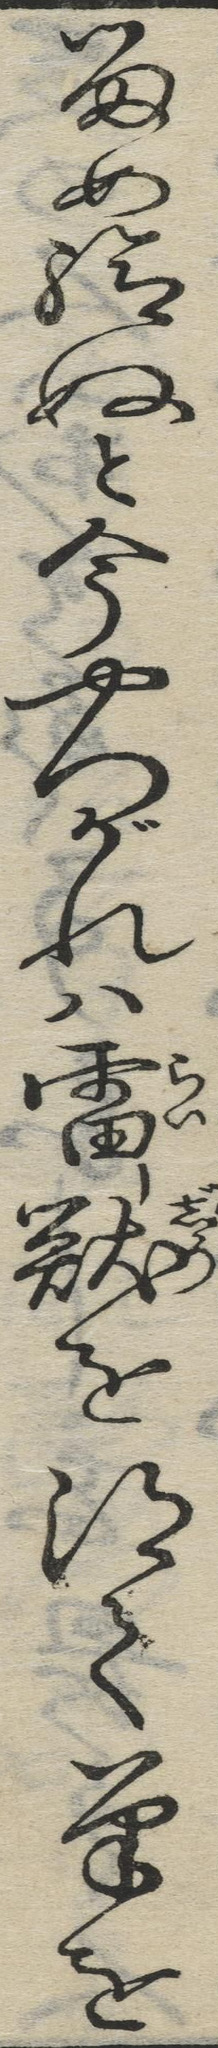留め給ぬと今やつがれは雷獣を得て筆を
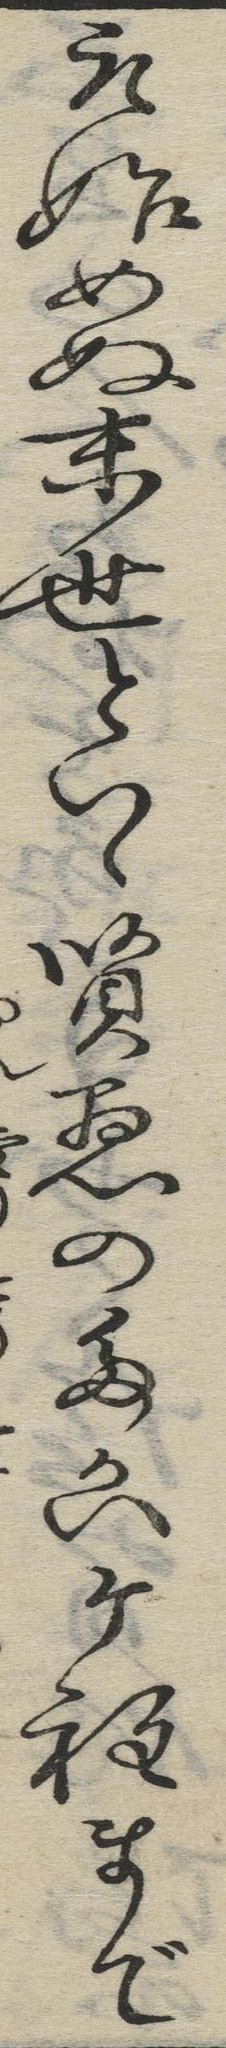取始めぬ末世といゝ賢愚のたかいヶ程まで
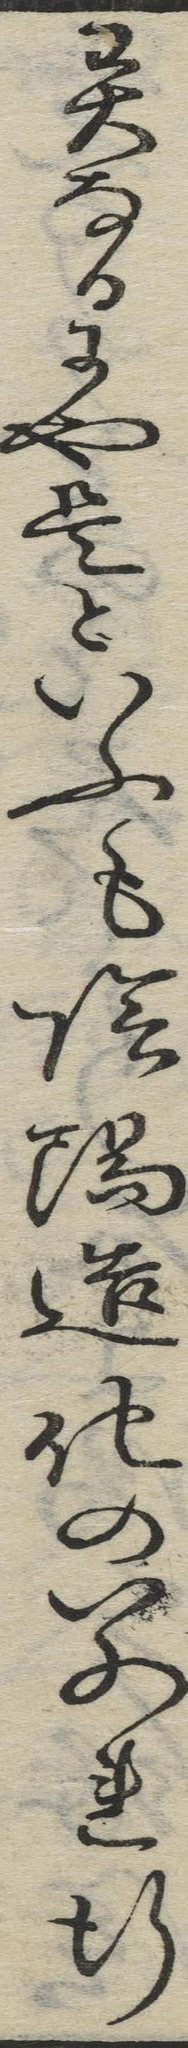異なるにや是といふも陰陽造化の別れ行
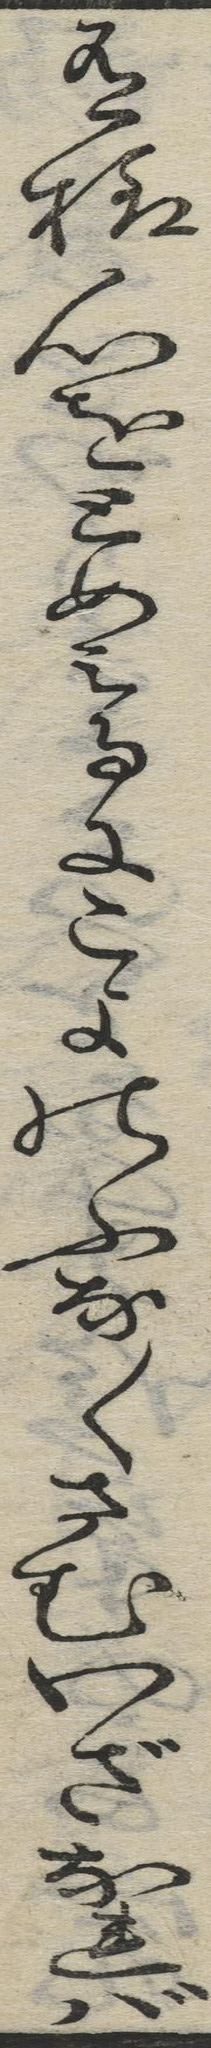有様心をとめみるにこよのふなくさむわざなれば
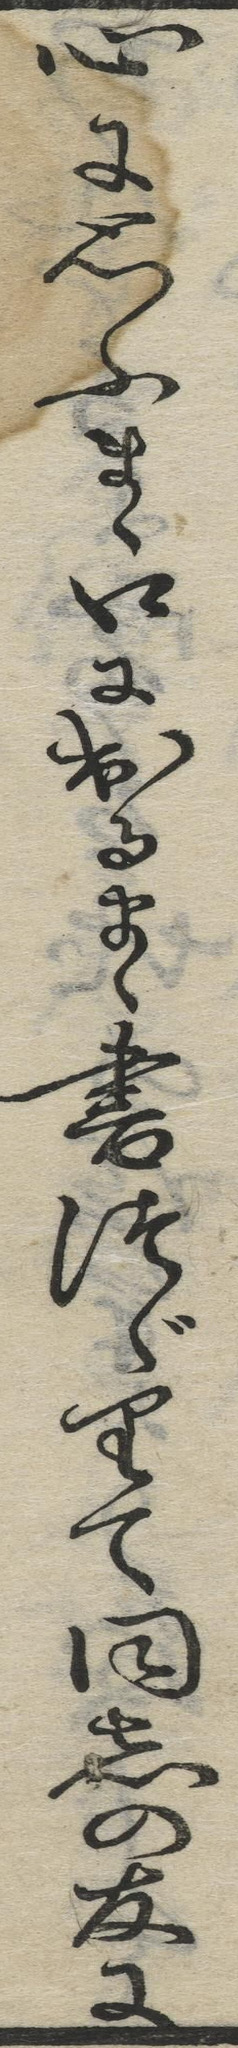心に思ふまゝ口に出るまゝ書つゞりて同志の友に
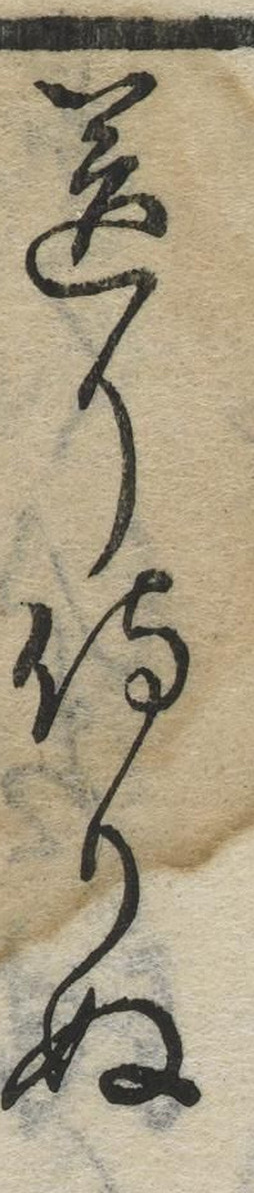送り侍りぬ
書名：雷震記　完
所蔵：東京大学地震研究所図書室 Earthquake Research Institute Library, The University of Tokyo, JAPAN
